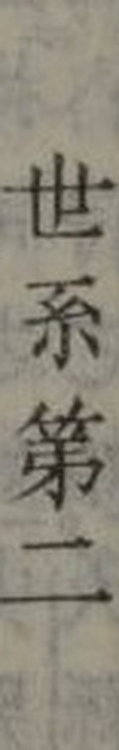世系第二
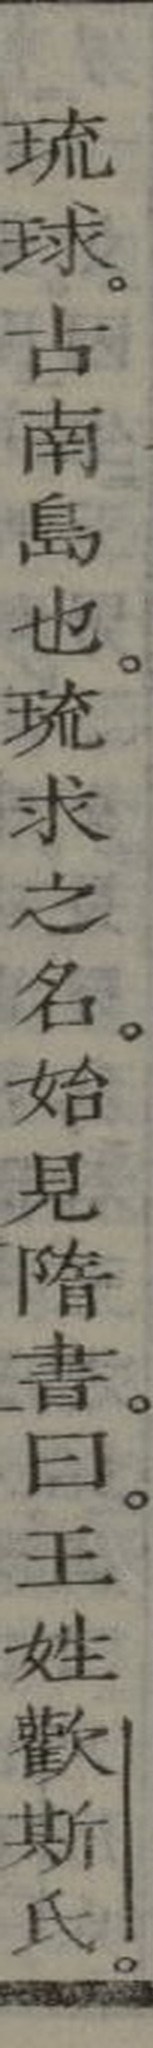琉球。古南島也。琉求之名。始見隋書。曰。王姓歡斯氏。
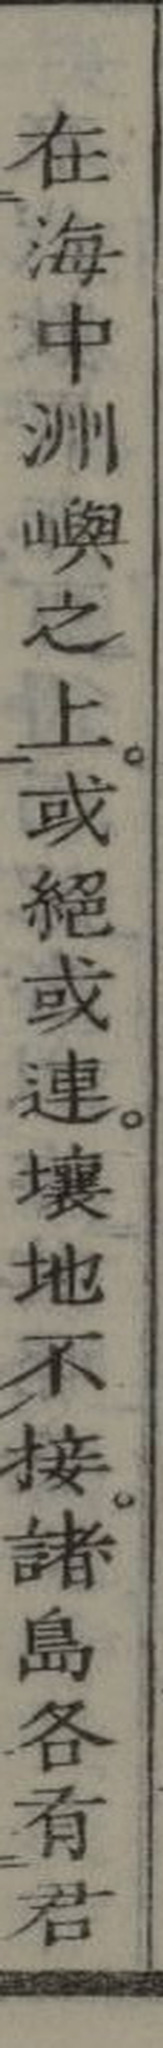在海中洲嶼之上。或絕或連。壤地不接。諸島各有君

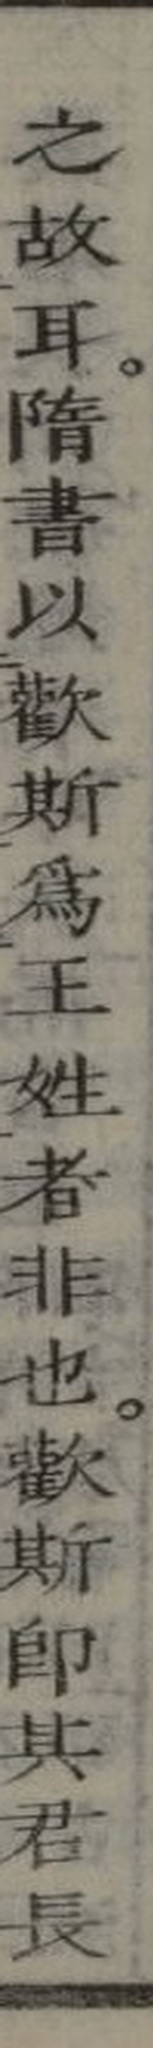之故耳。隋書以歡斯爲王姓者非也。歡斯卽其君長
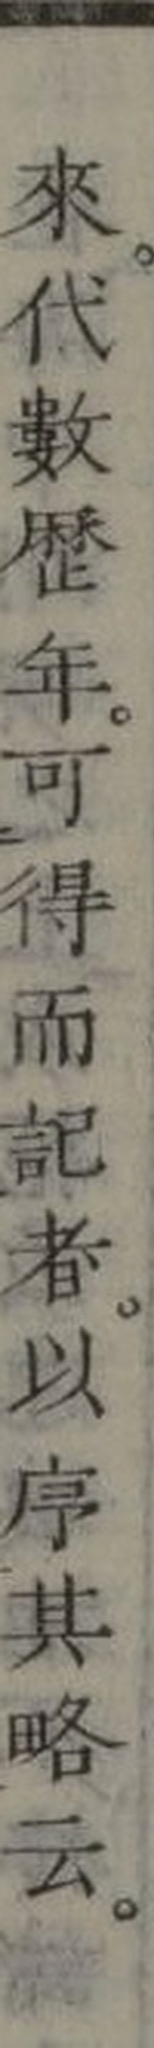來。代數歴年。可得而記者。以序其略云。
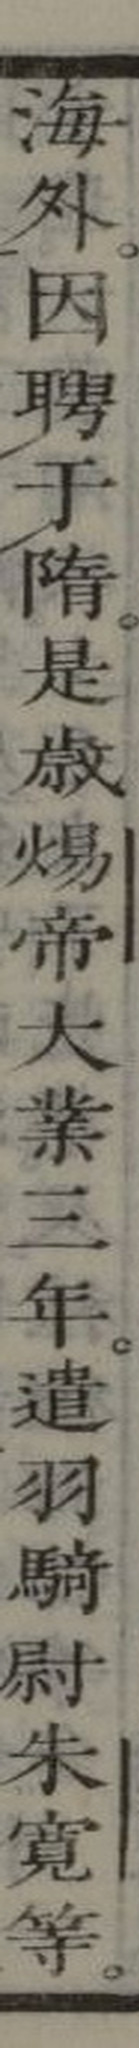海外。因聘于隋。是歳煬帝大業三年。遣羽騎尉朱寛等。
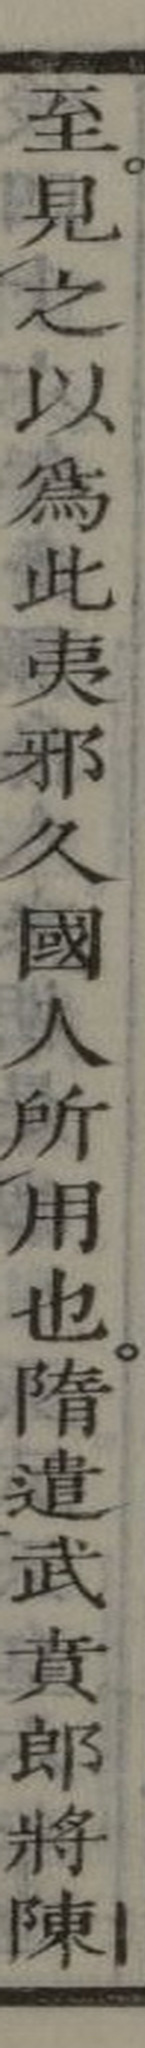至。見之以爲此夷邪久國人所用也。隋遣武賁郎將陳

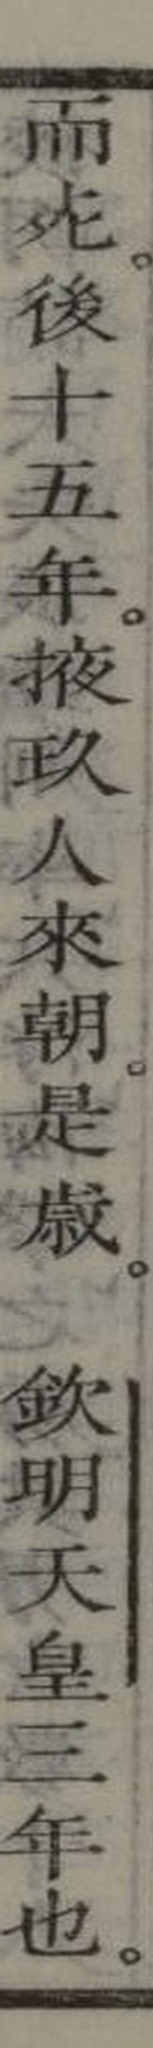而死。後十五年。掖玖人來朝。是歳。欽明天皇三年也。
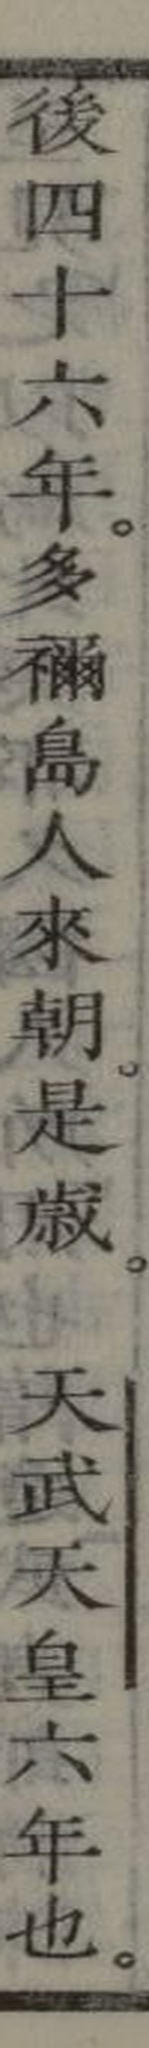後四十六年。多禰島人來朝。是歳。天武天皇六年也。
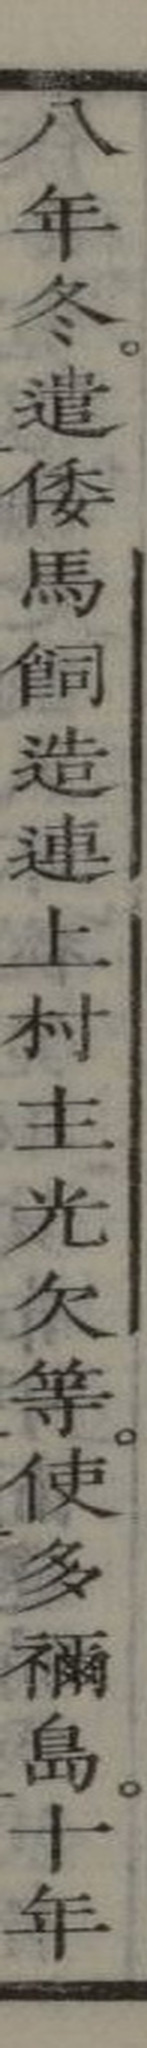八年冬。遣倭馬飼造連上村主光欠等。使多禰島。十年
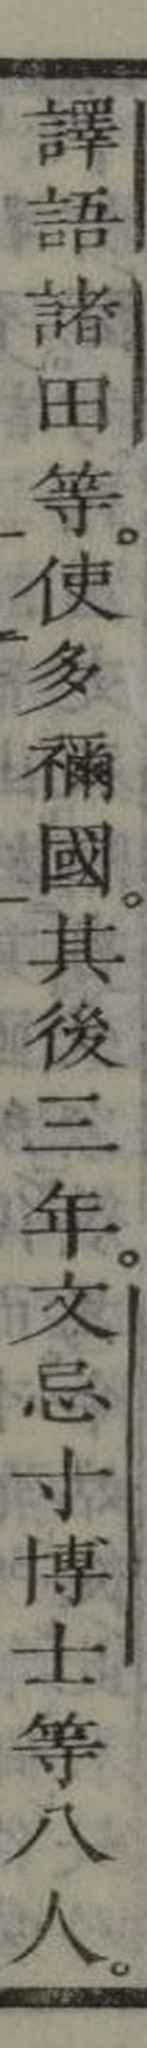譯語諸田等。使多禰國。其後三年。文忌寸博士等八人。
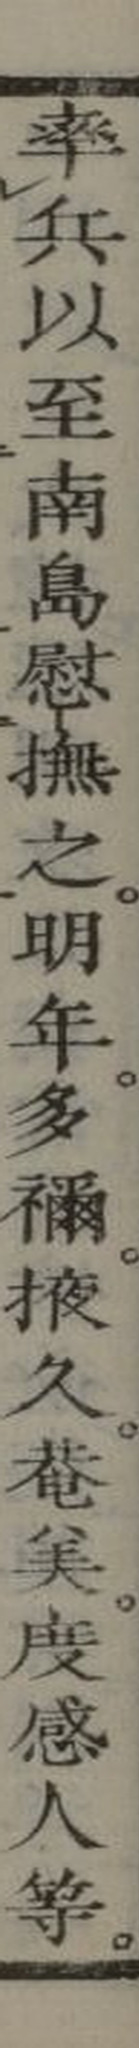率兵以至南島慰-撫之。明年。多禰。掖久。菴美。度感人等。
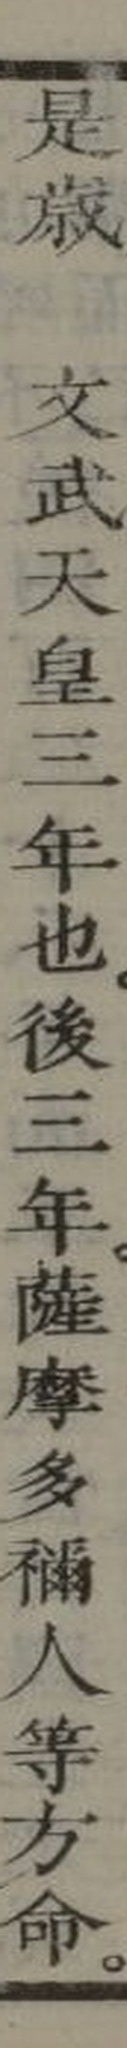是歳。文武天皇三年也。後三年。薩摩多禰人等方命。
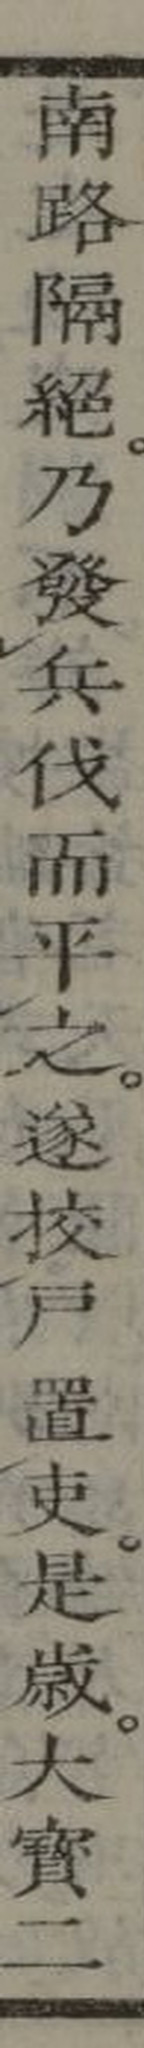南路隔絕。乃發兵伐而平之。遂挍戸置吏。是歳。大寳二
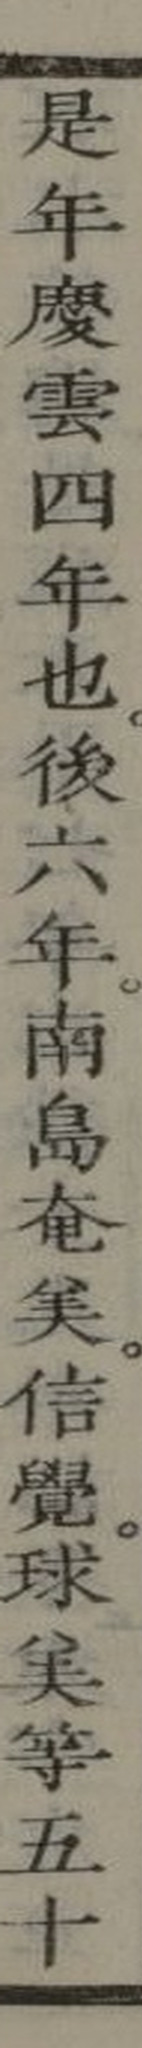是年慶雲四年也。後六年。南島奄美。信覺。球美等五十
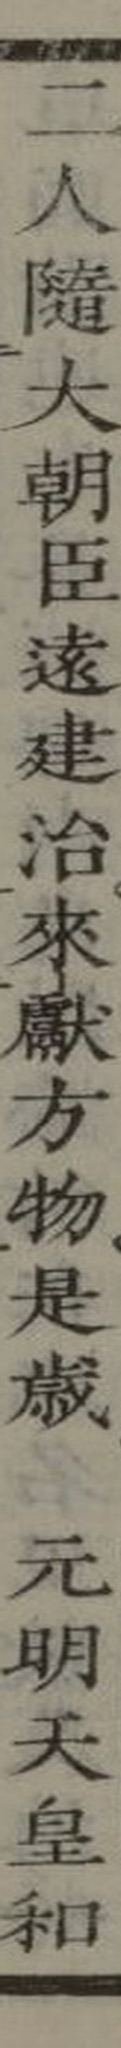二人。隨大朝臣逺建治。來-獻方物。是歳。元明天皇和
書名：南島志 呂
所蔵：University of the Ryukyus Library
